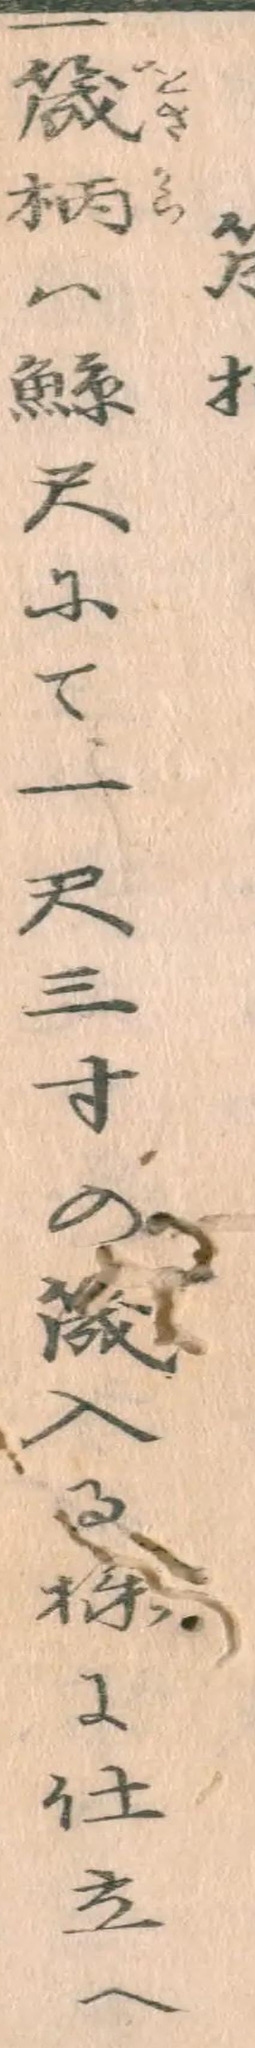一筬柄は鯨尺にて一尺三寸の筬入る様に仕立へ
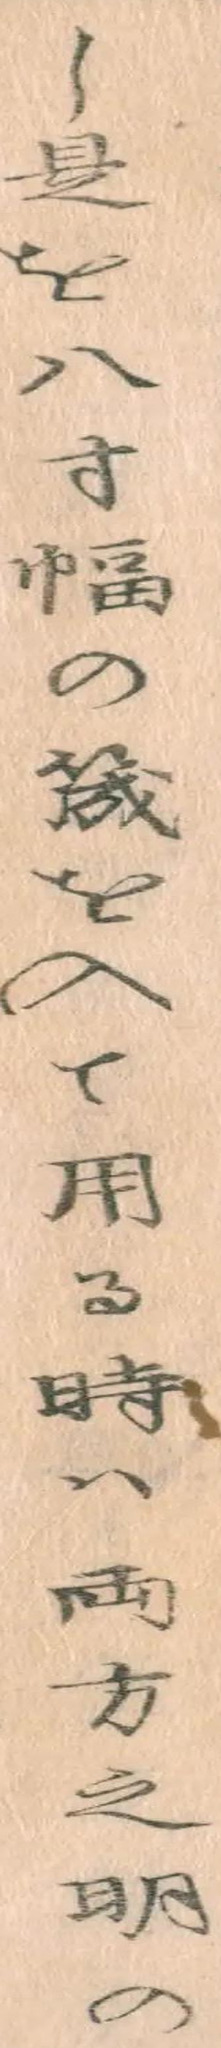し是を八寸幅の筬を入て用る時は両方之明の
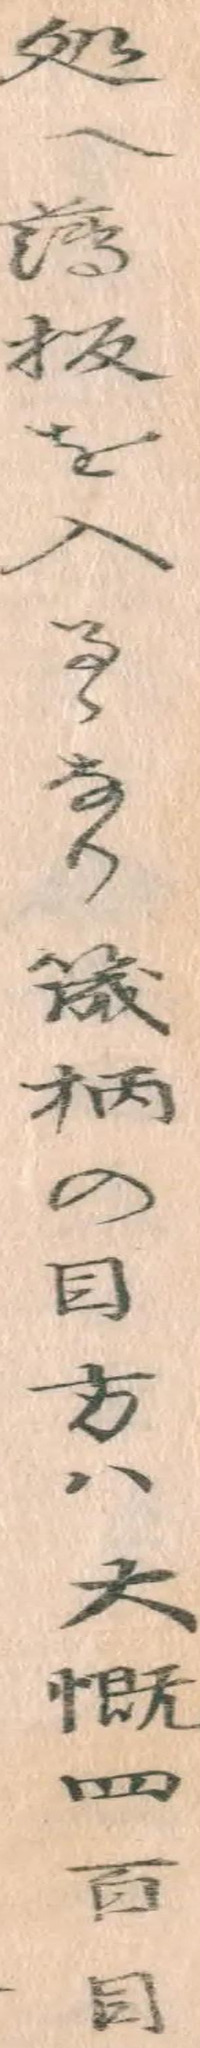処へ薄板を入るゝなり筬柄の目方は大慨四百目
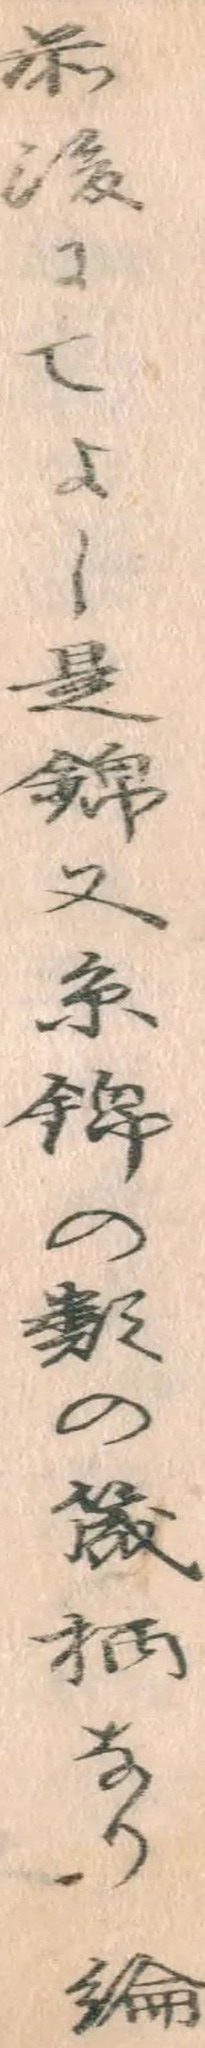前後にてよし是錦又糸錦の類の筬柄なり綸
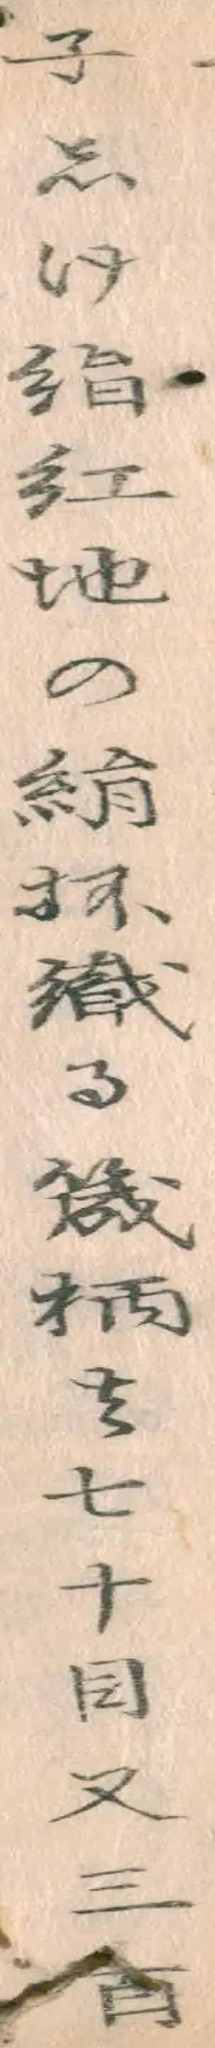子しけ𥿻紅地の絹抔織る筬柄は七十目又三百
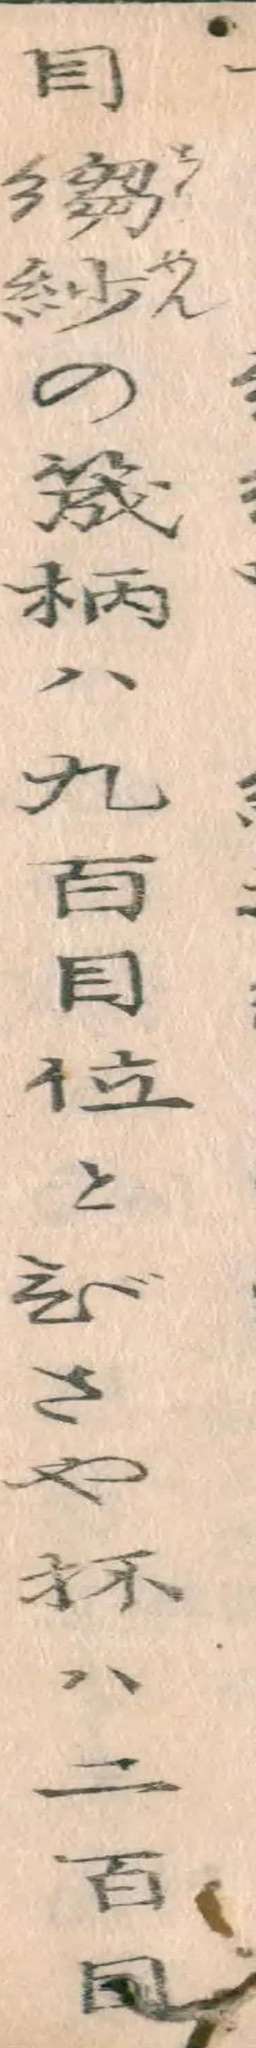目縐紗の筬柄は九百目位とびさや抔は二百目
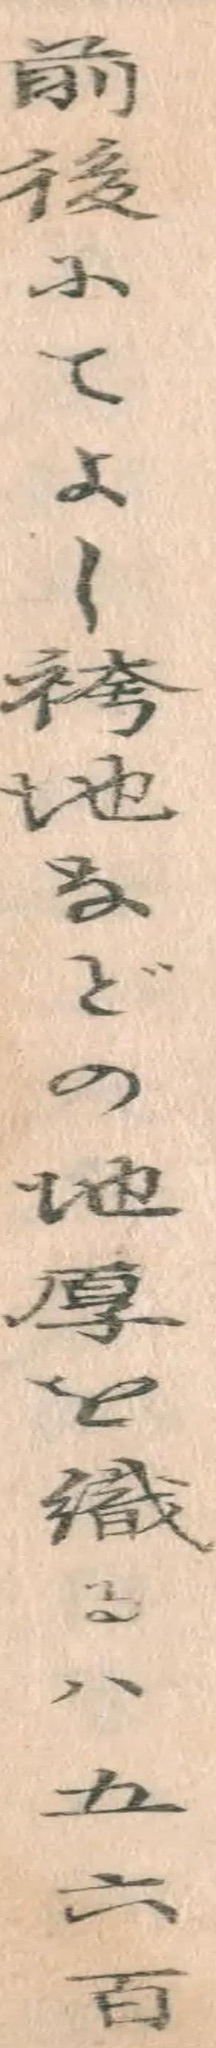前後にてよし袴地などの地厚を織るは五六百
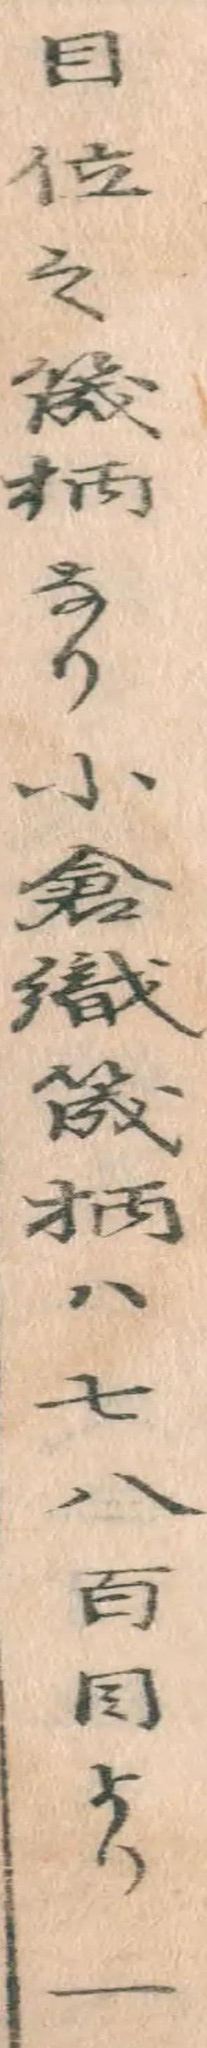目位之筬柄なり小倉織筬柄は七八百より一

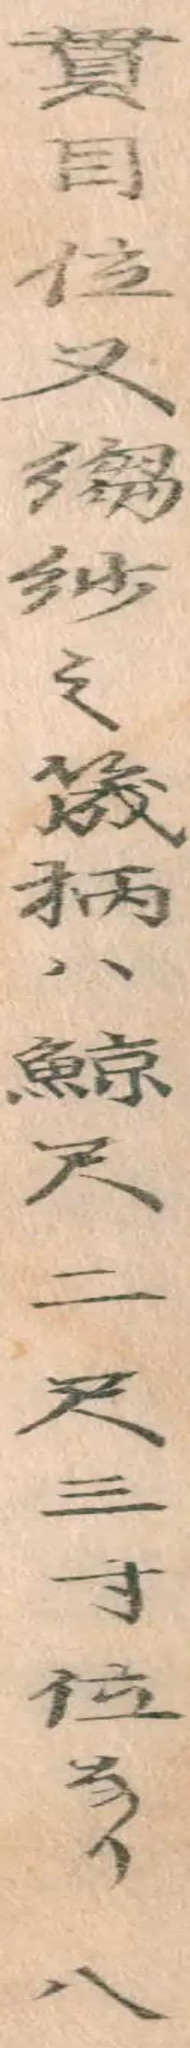貫目位又縐紗之筬柄は鯨尺二尺三寸位なり八
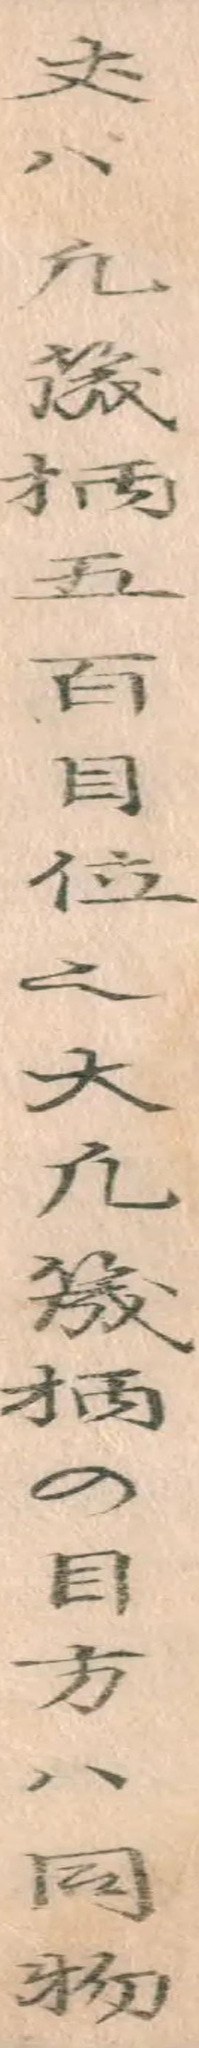丈は凡筬柄五百目位也大凡筬柄の目方は同物
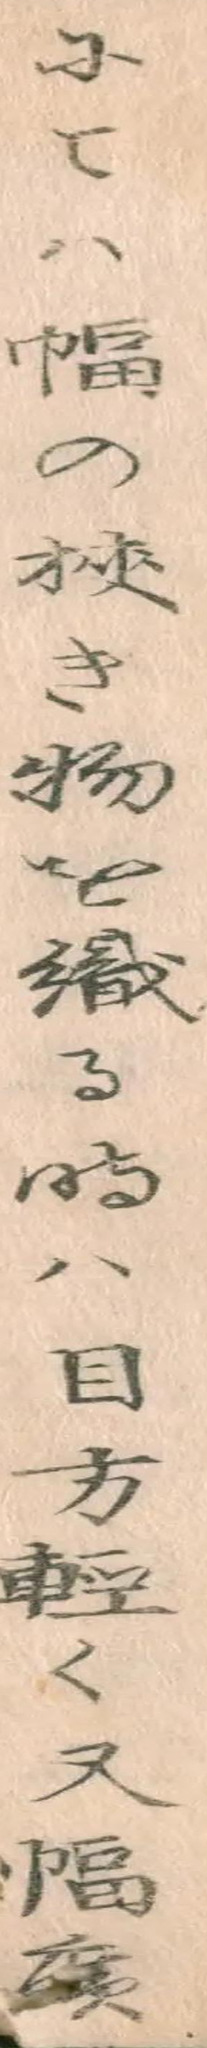にては幅の狭き物を織る時は目方軽く又幅広
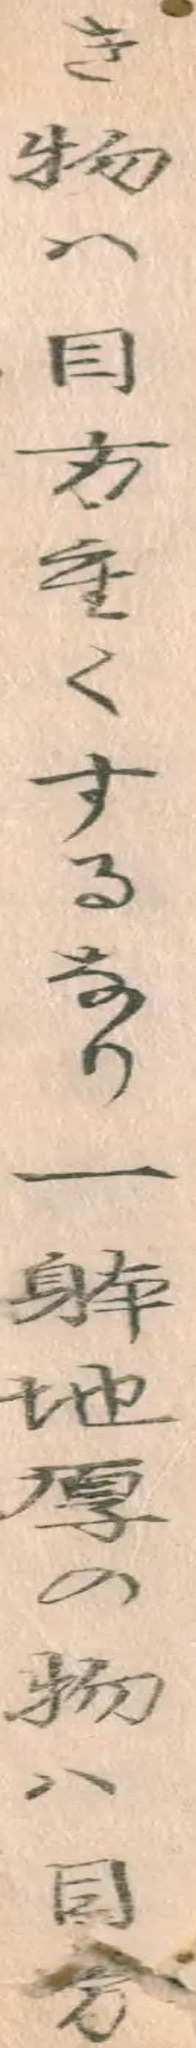き物は目方重くするなり一体地厚の物は目方
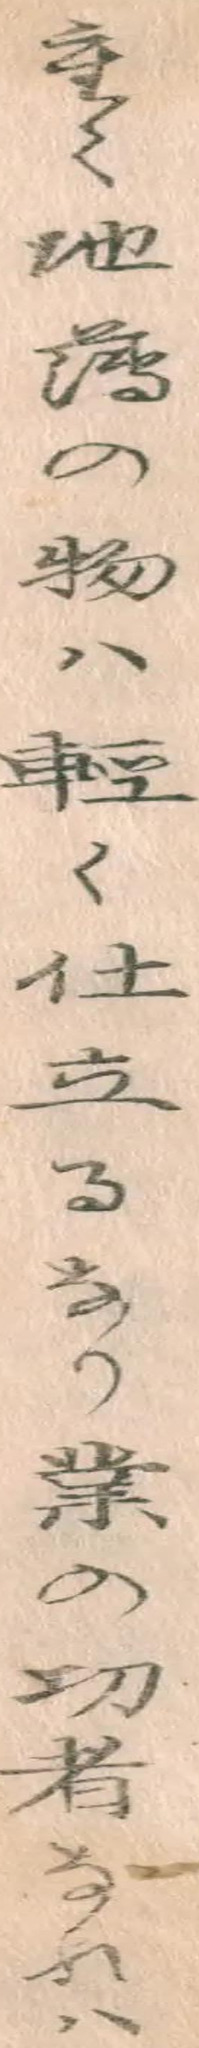重く地薄の物は軽く仕立るなり業の功者なれは
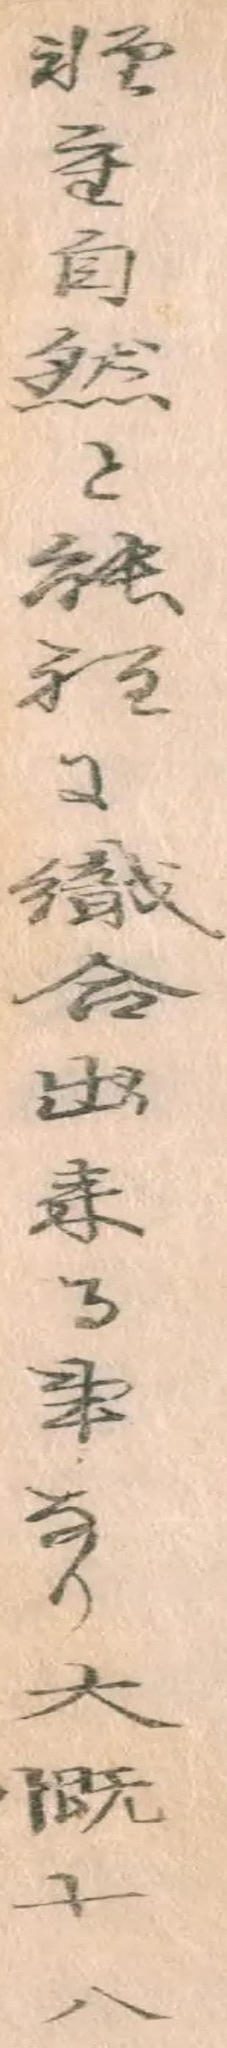軽重自然と能程に織合出来る事なり大慨七八
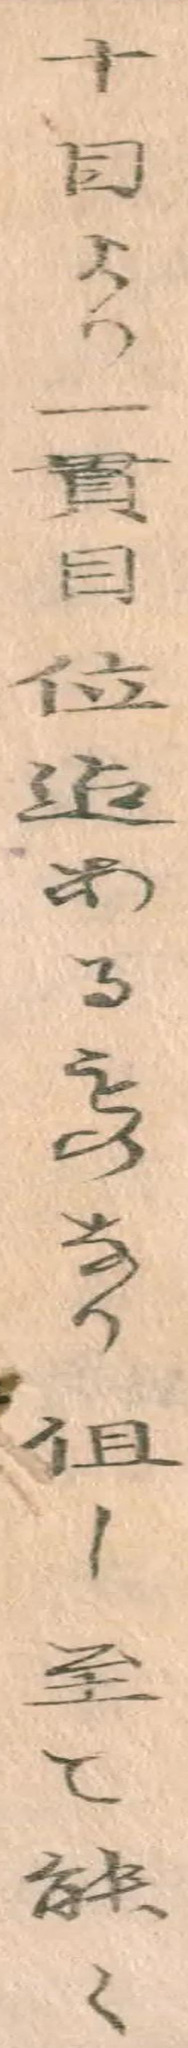十目より一貫目位迄あるものなり但し至て能く
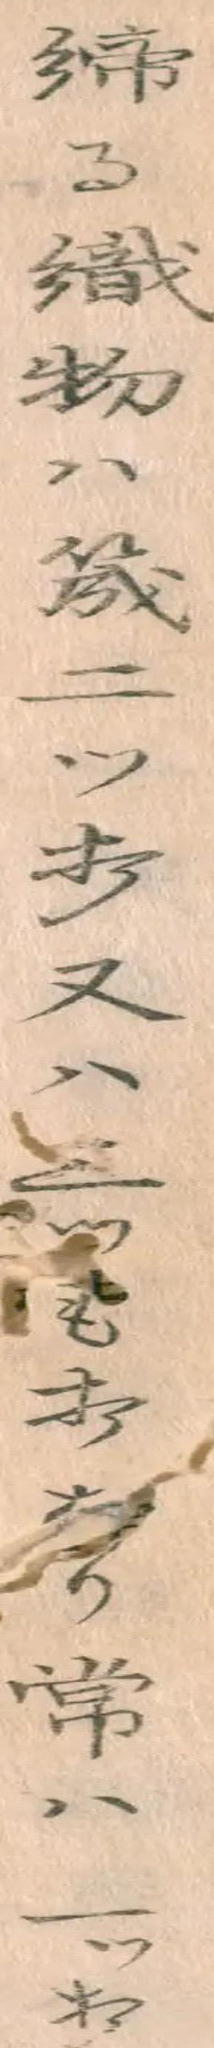締る織物は筬二ッ打又は三ッも打なり常は一ッ打
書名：機織彙編 5巻. [2]
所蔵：国立国会図書館 National Diet Library, JAPAN
